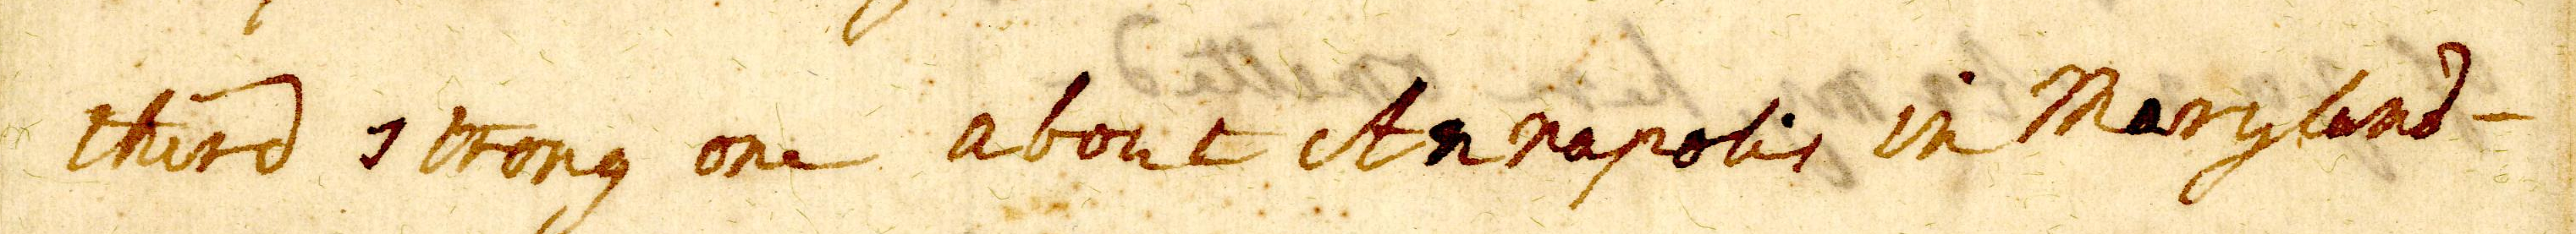third strong one about Annapolis in Maryland-
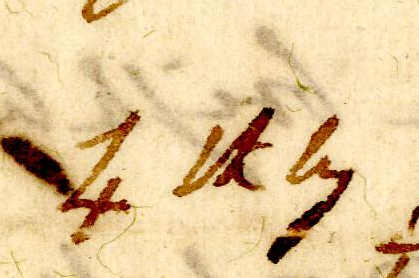4^thly
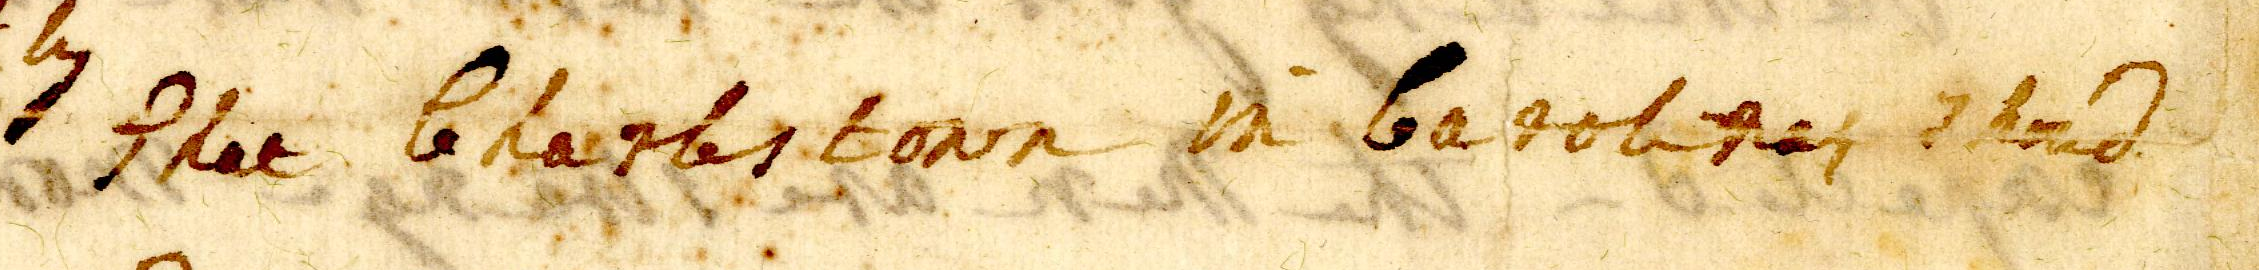That Charlestown in Carolinas shoud
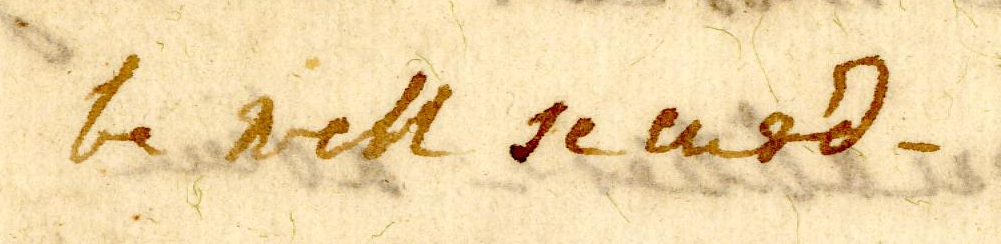be well securd-
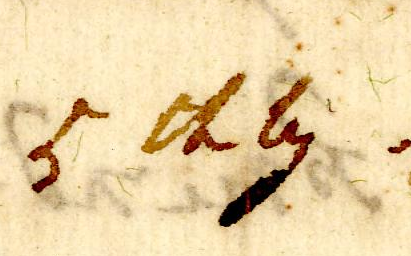5^thly
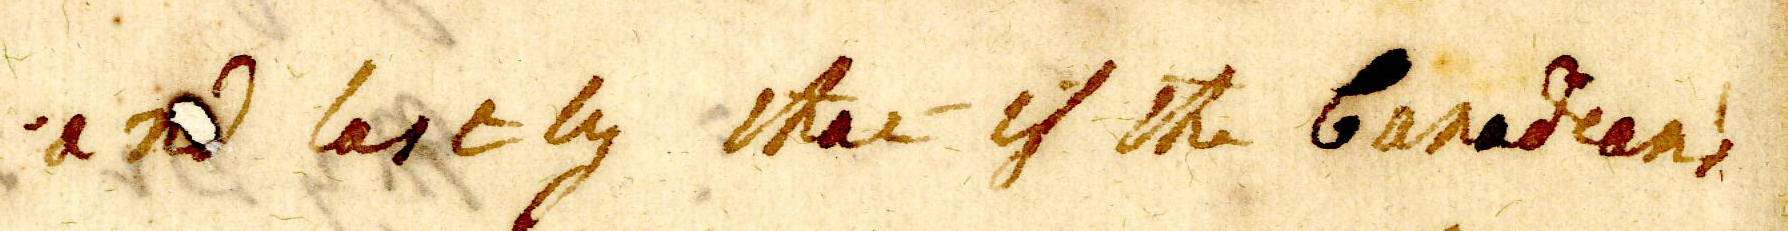and lastly that if the Canadian's
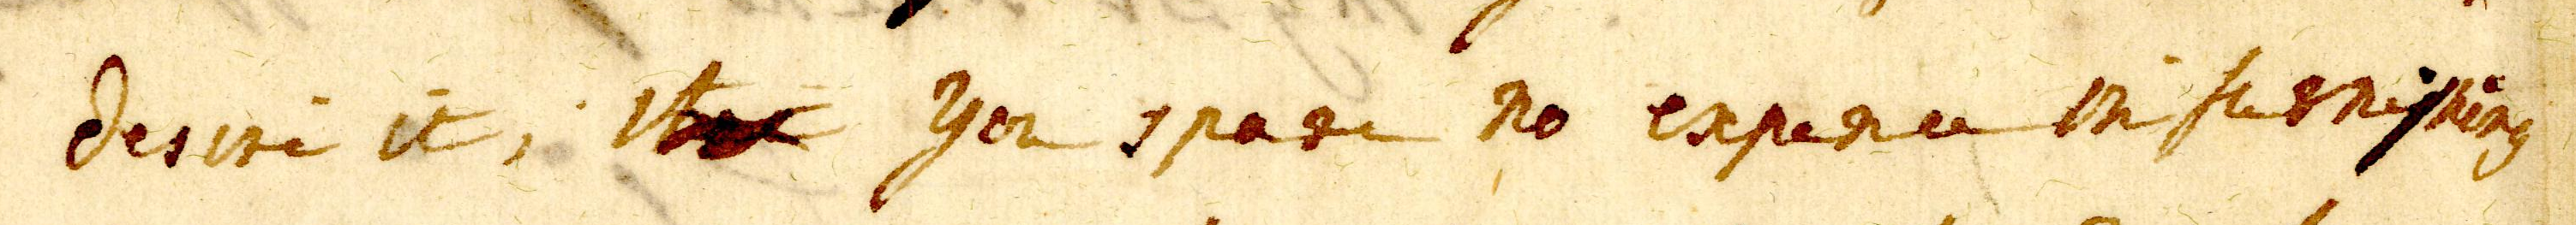desire it, that You spare no expense in furnishing
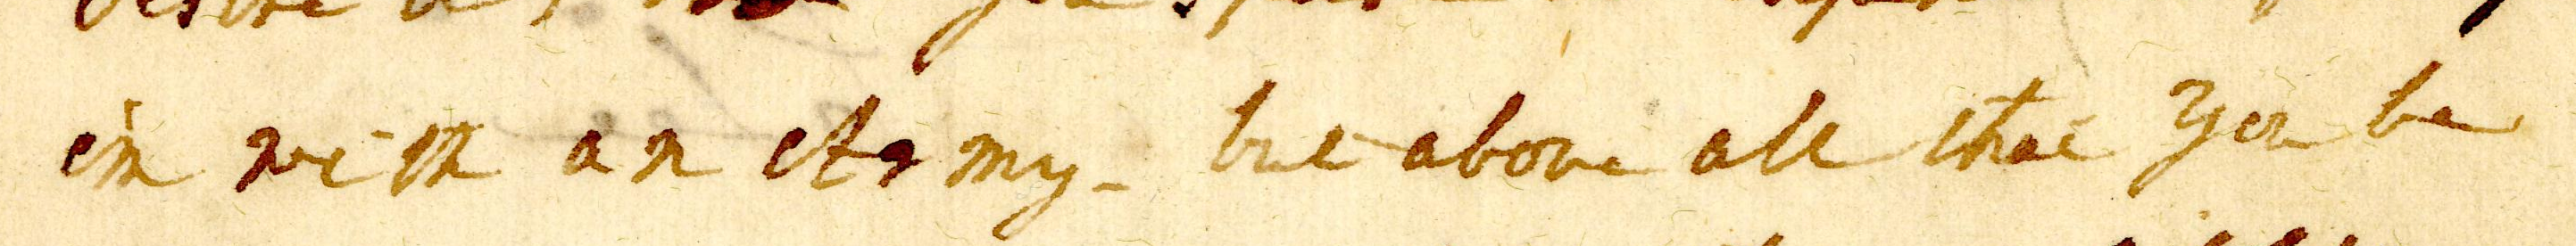in with an etamy but above all that you be
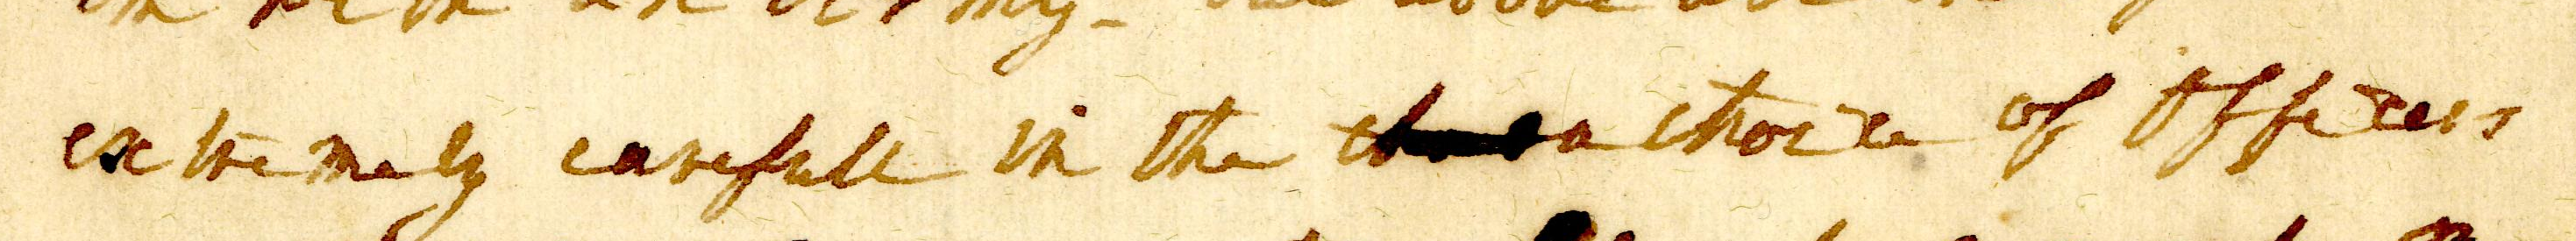extremely carefull in the [___] a choice of Officers
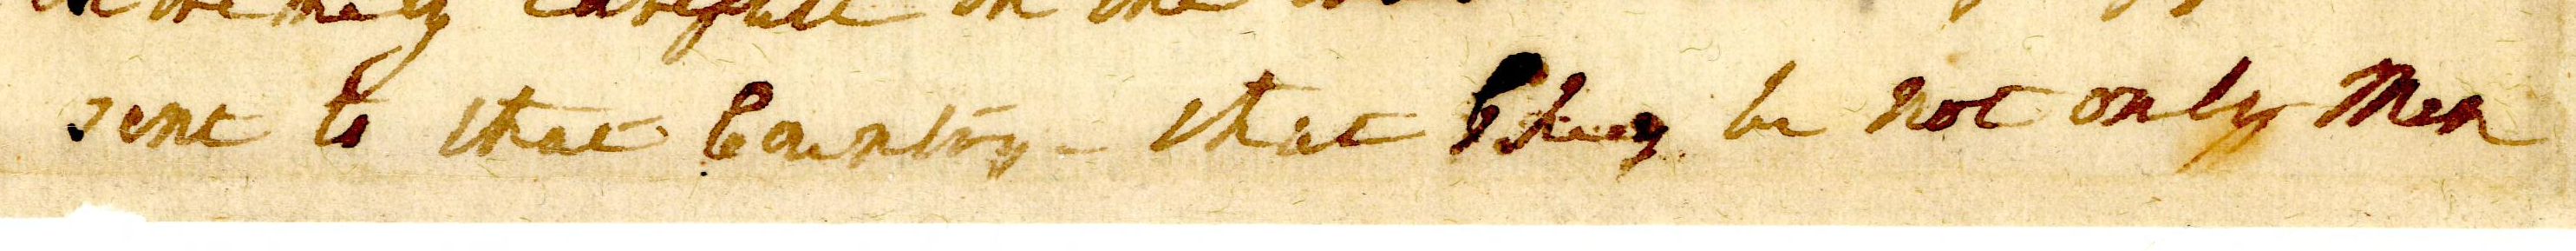sent to that Country- that they be not only Men
